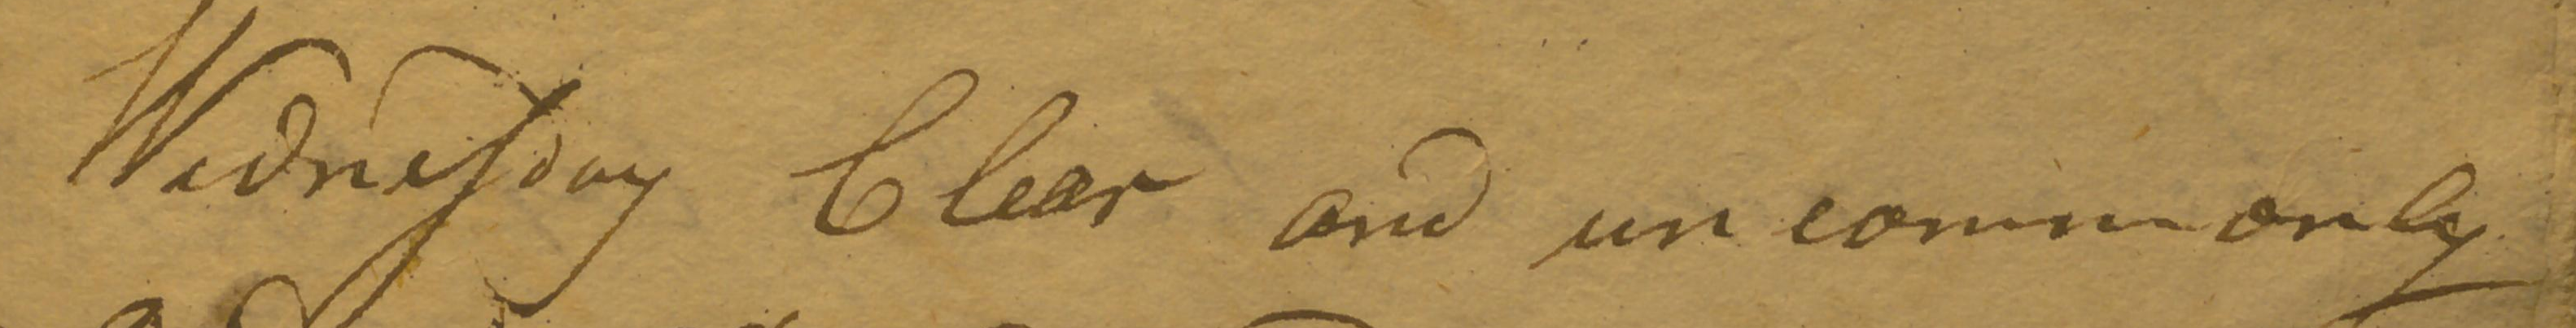Wednessay Clear and uncommonly
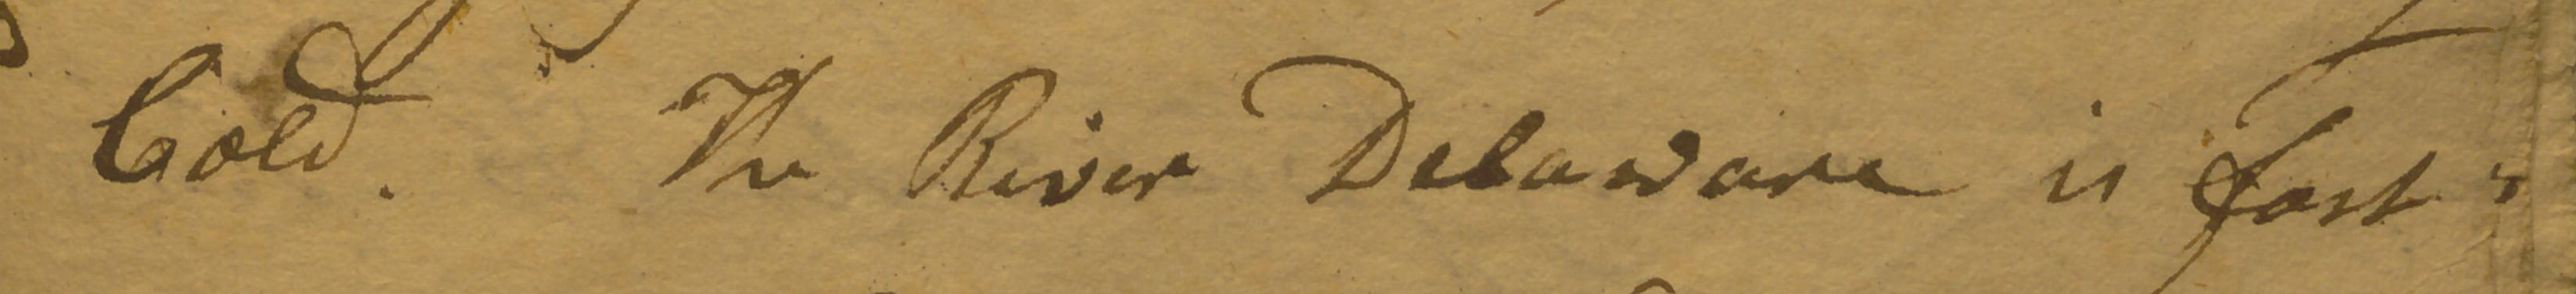Cold. The River Delaware is fast.
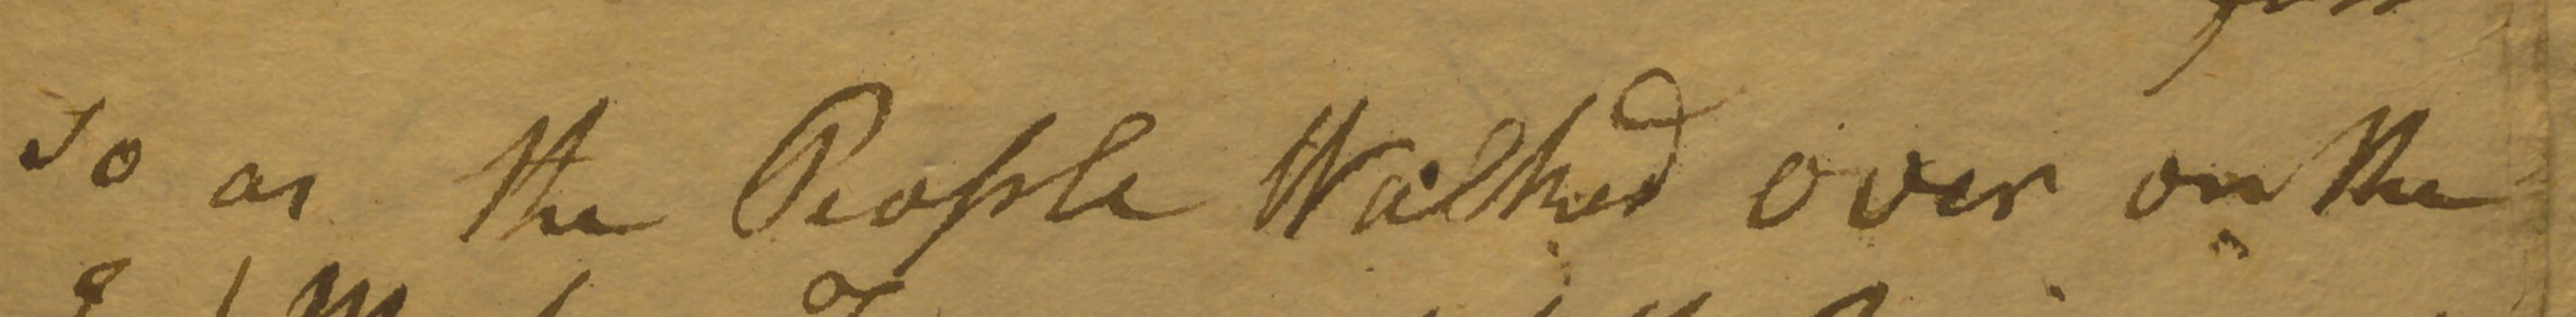so as the People Walked over on the
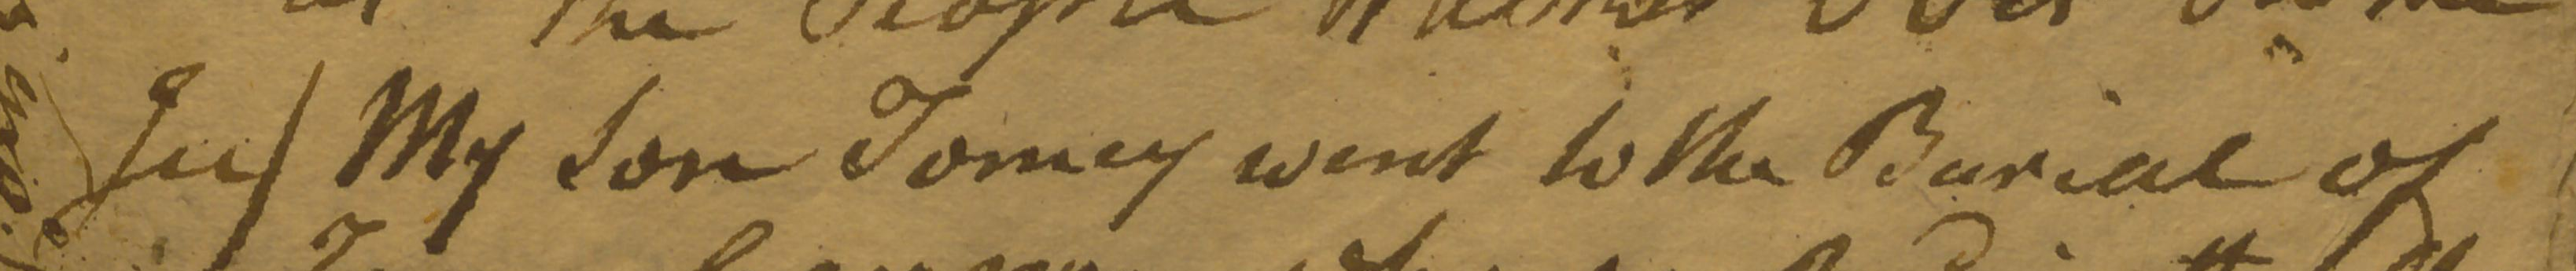Ice) My Son Tomey went to the Burial of
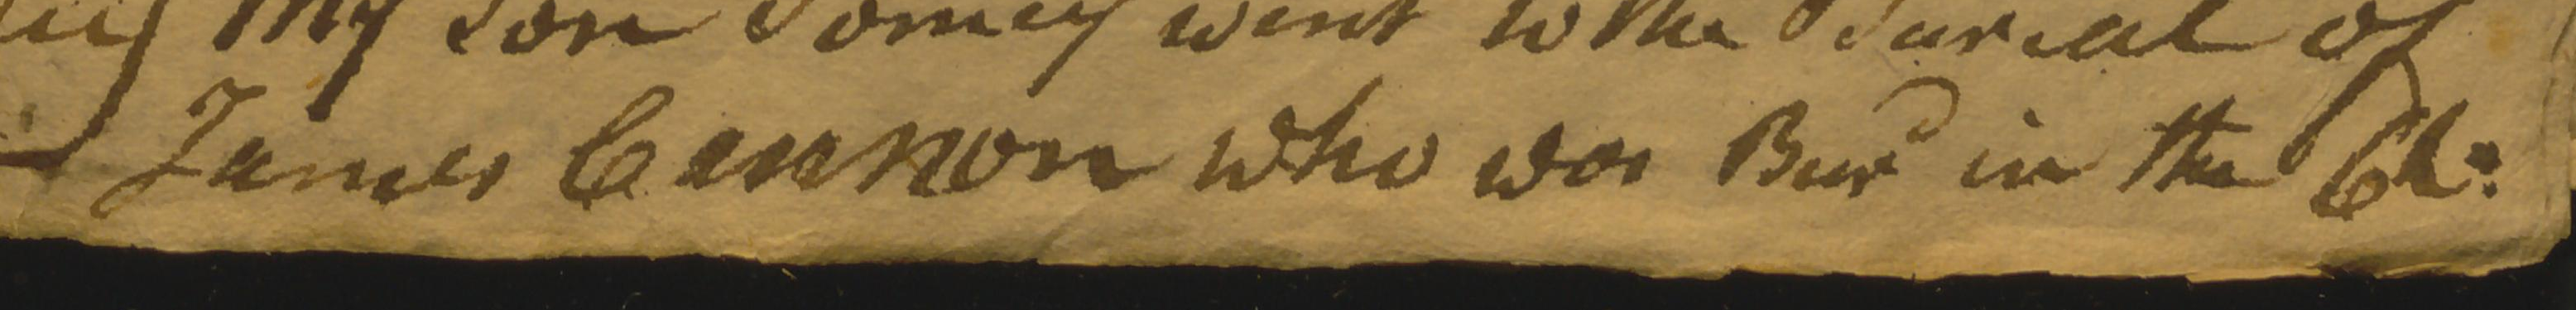James Cannon who was Bur^d in the Ch.
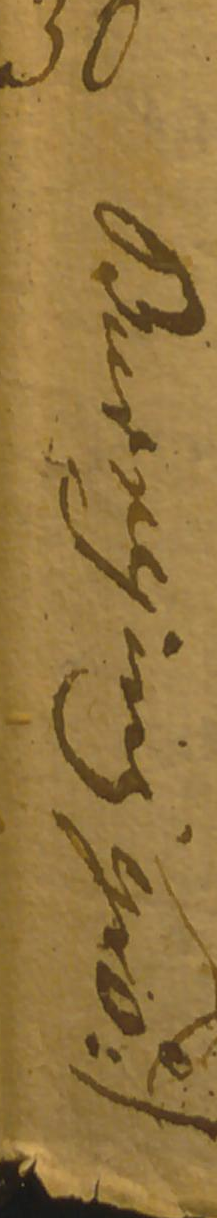Burrying gro:
